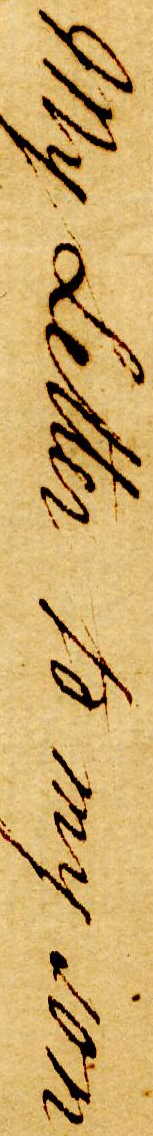My Letter to my son
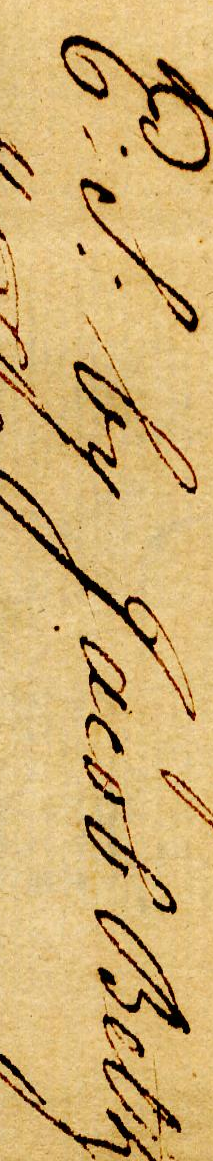E: S: by Jacob Beltz
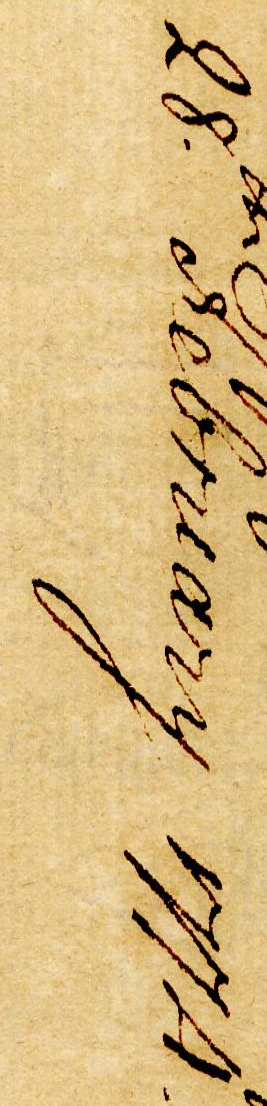28.^th February 1774.
